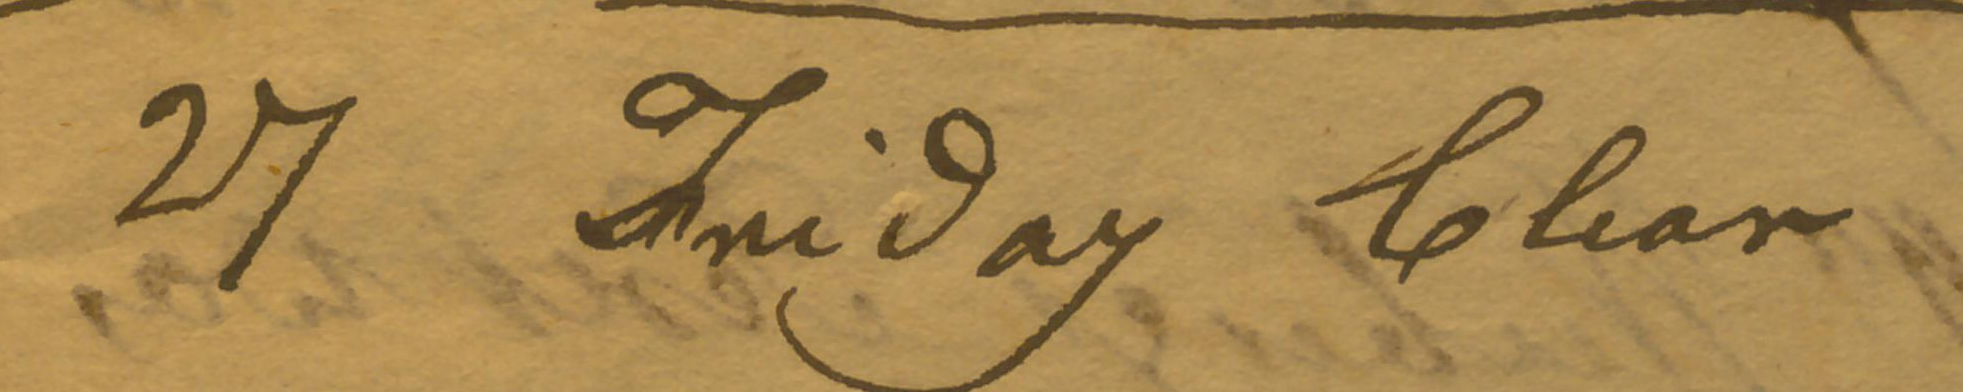27 Friday Clear
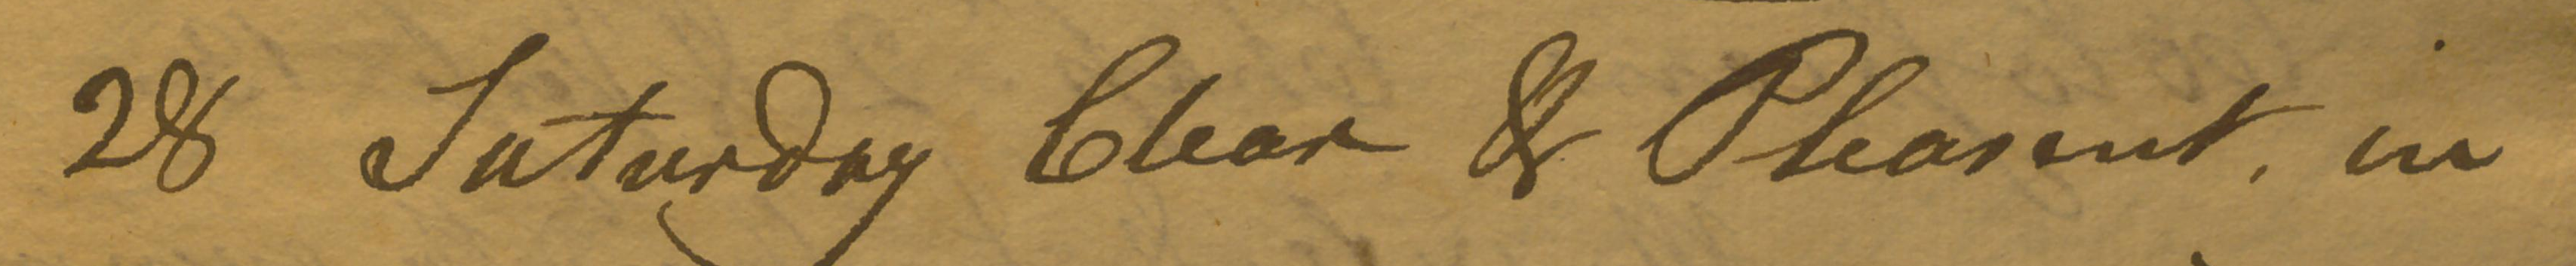28 Saturday Clear & Pleasent, in
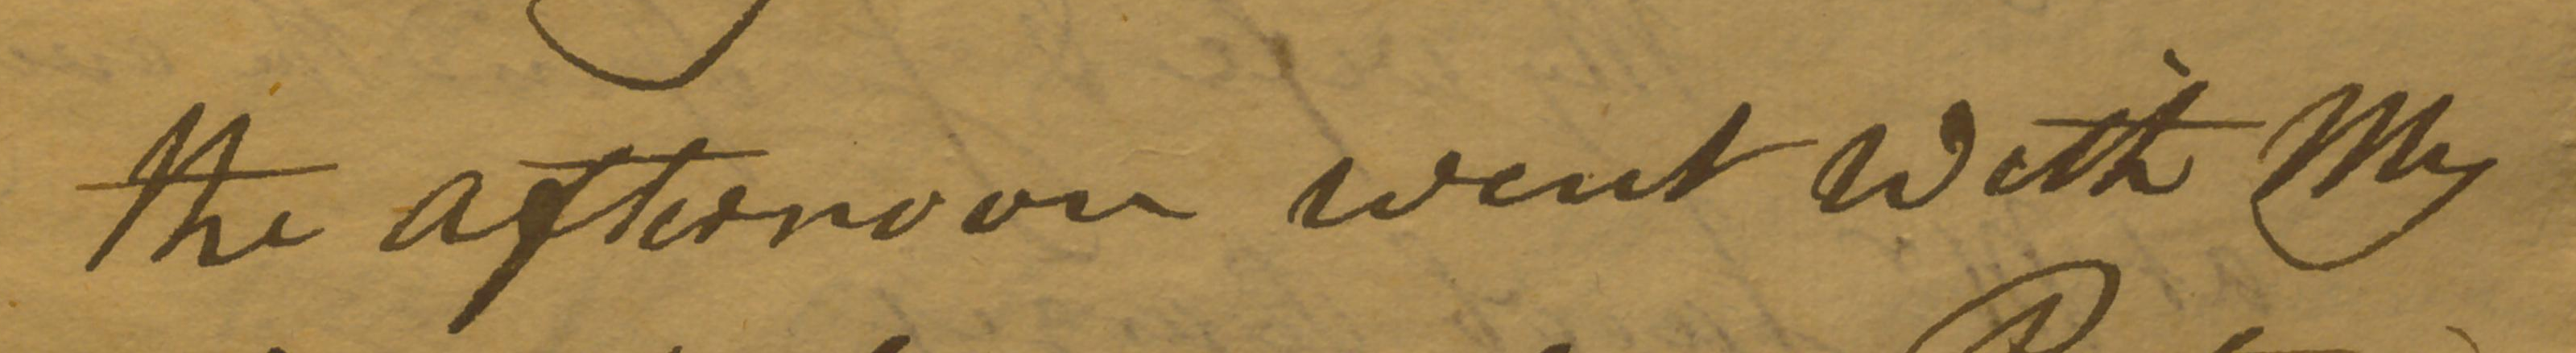the afternoon went with My
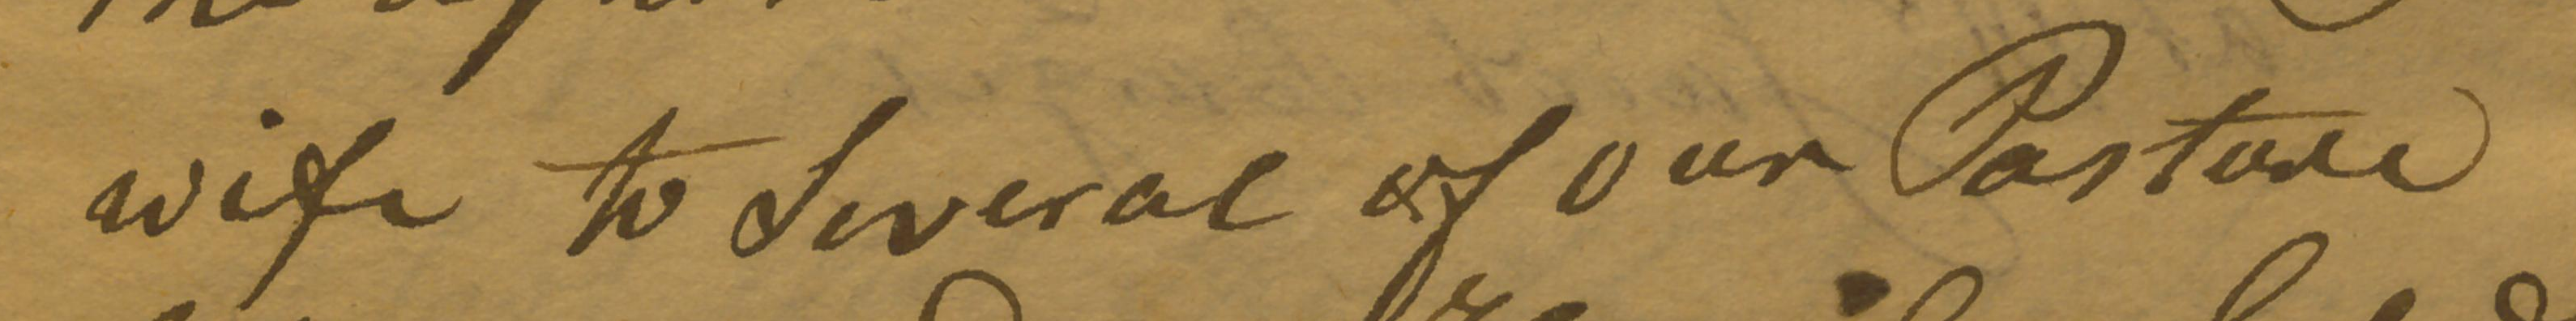wife to several of our Pasture
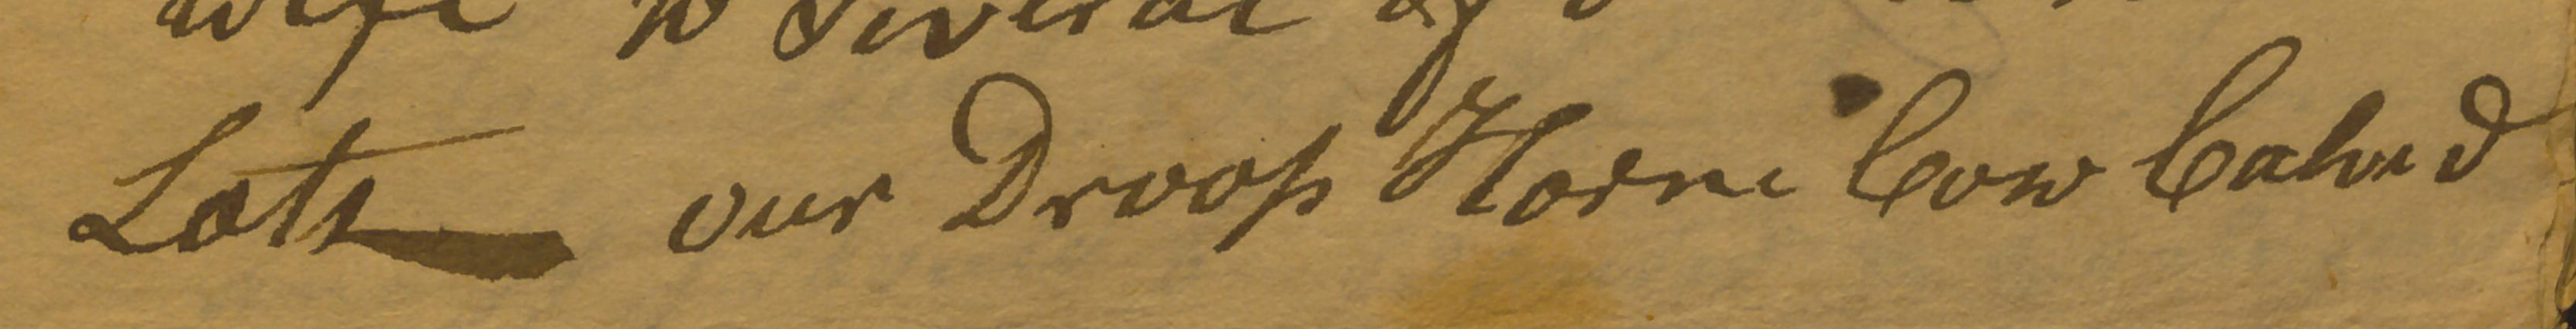Lots- our Droop Horne Cow Calved
